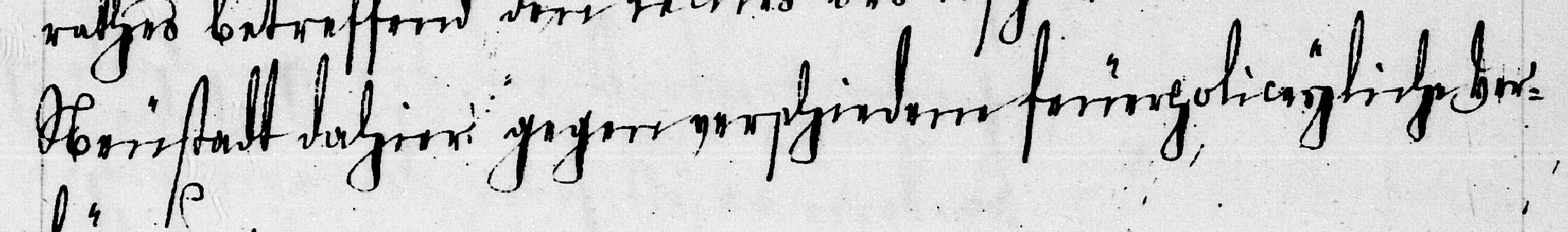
Neustadt dahier gegen verschiedene feuerpoliceyliche Ver¬
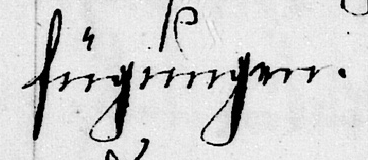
fügungen.
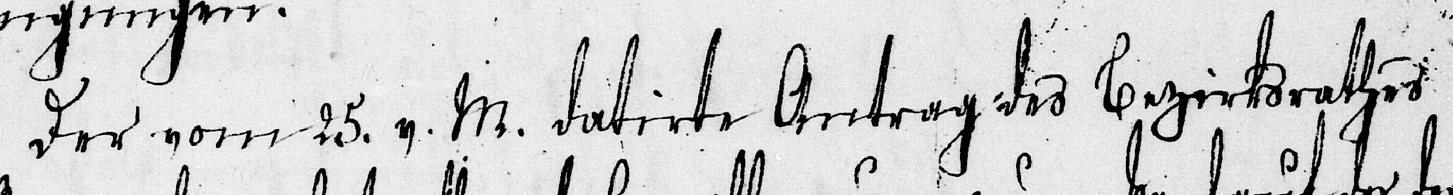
Der vom 25. v. M. datirte Antrag des Bezirksrathes
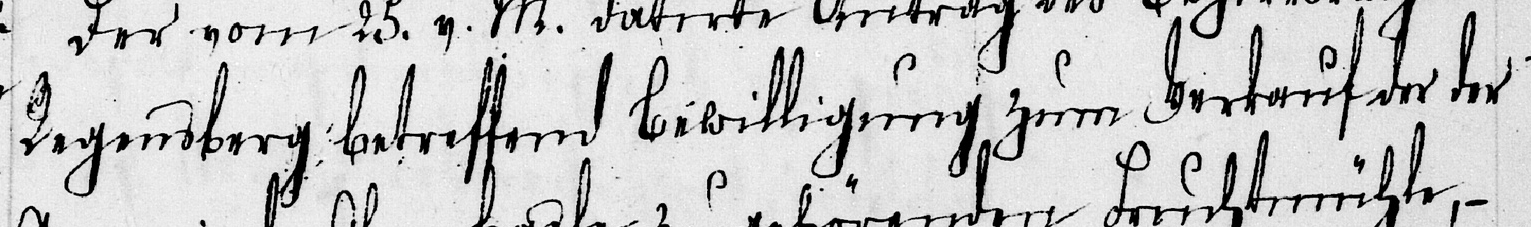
Regensberg betreffend Bewilligung zum Verkauf der der
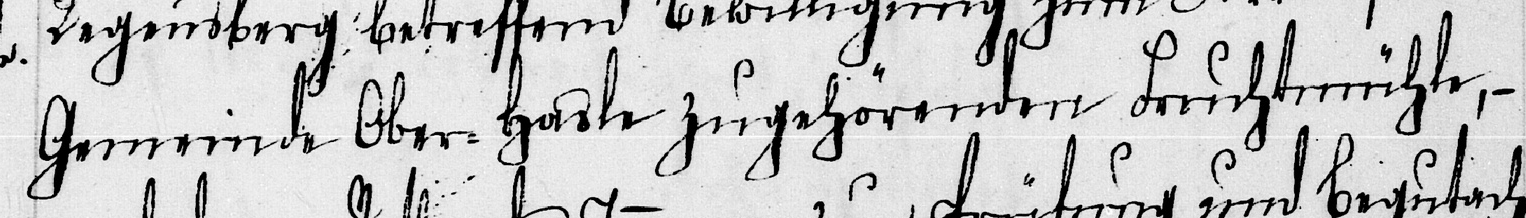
Gemeinde Ober-Hasle zugehörenden Fruchtmühle,
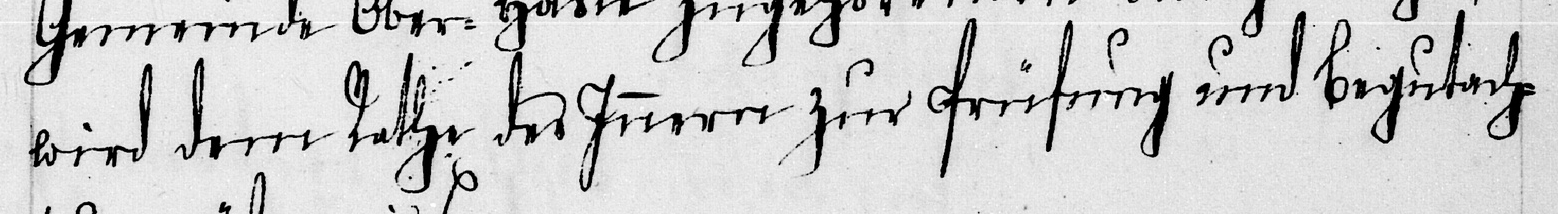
wird dem Rathe des Innern zur Prüfung und Begutach¬
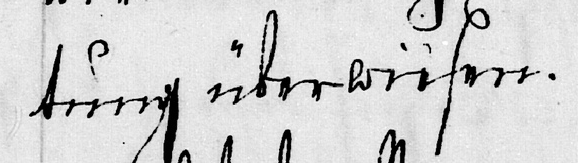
tung überwiesen.
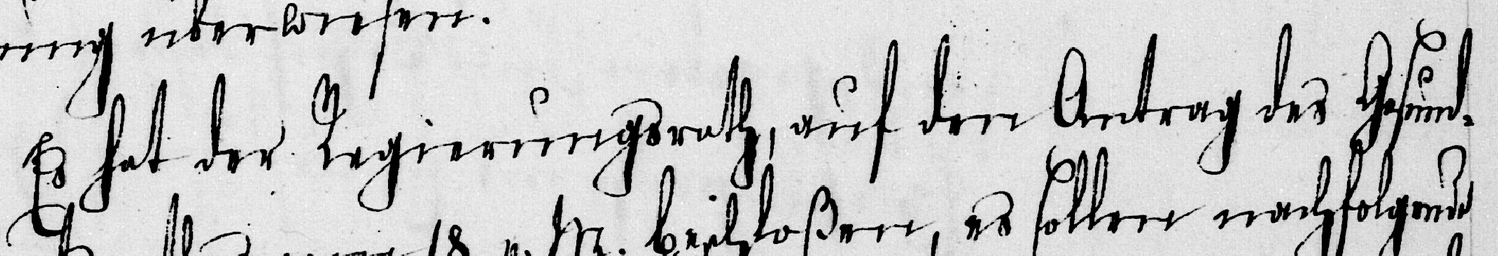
Es hat der Regierungsrath, auf den Antrag des Gesun¬
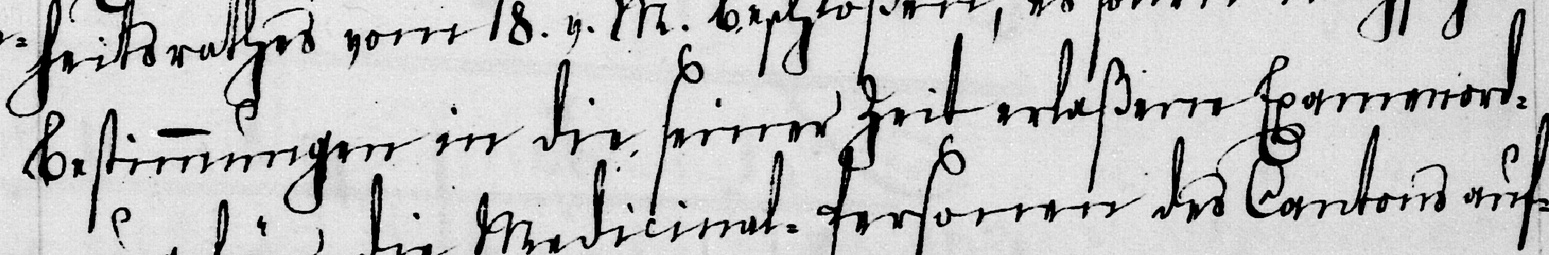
Bestimmungen in die seiner Zeit erlaßene Examenord¬
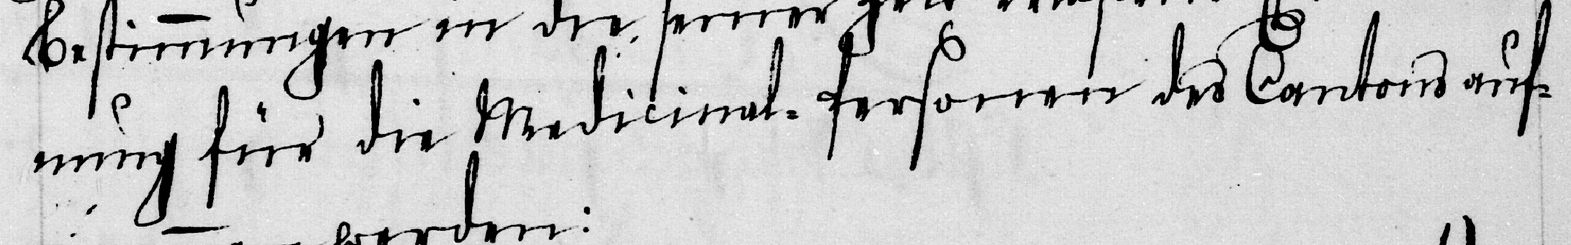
nung für die Medicinal-Personen des Cantons auf¬
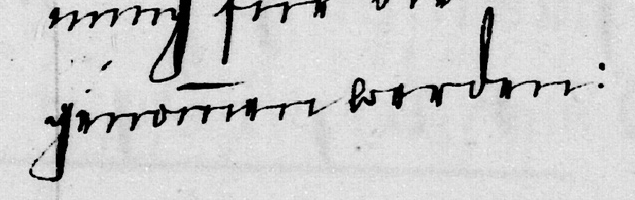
genommen werden:
